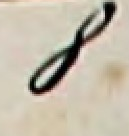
8
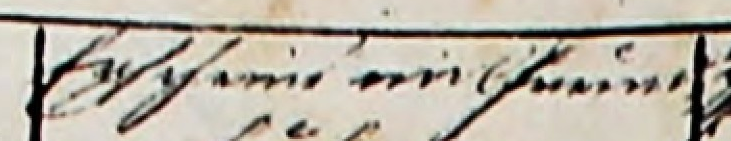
Erscheint im Grund„
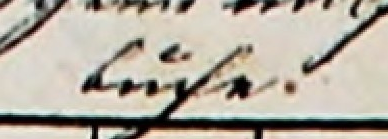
buche
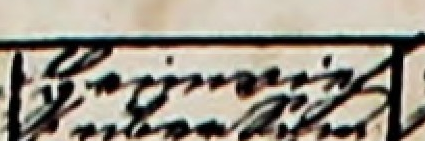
Heimvieh
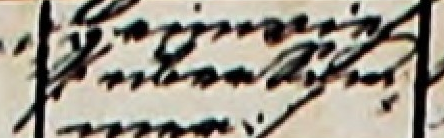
über S???
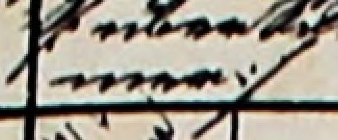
mer.
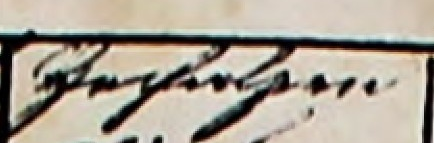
Zechalgen
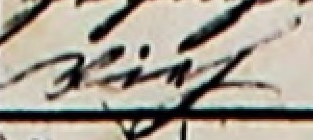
Vieh
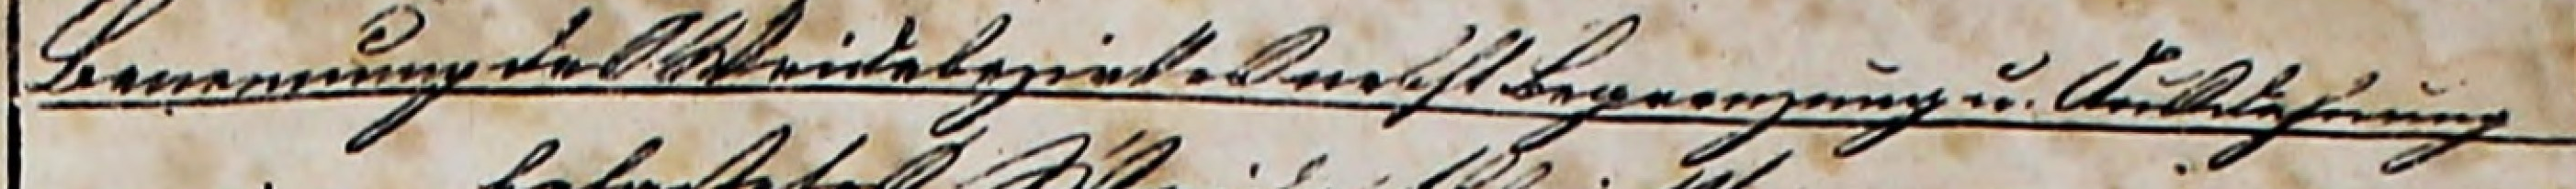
Benennung des Weidabezirkes nebst Begrenzung u. Ausdehnung
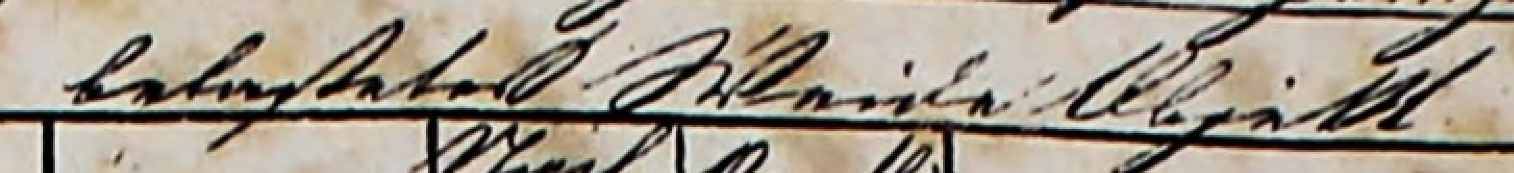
belaßetes Weide Objekt
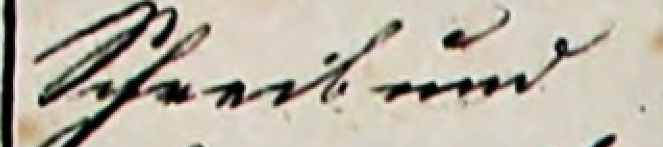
Schreib und
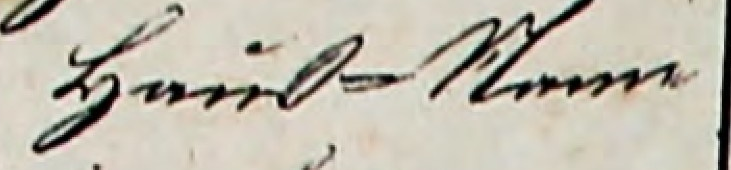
Haus=Name
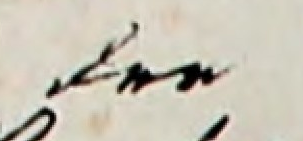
der
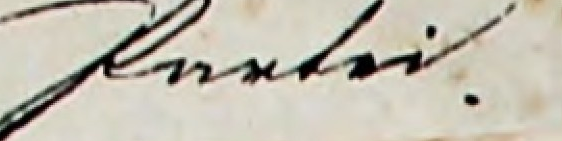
Partei
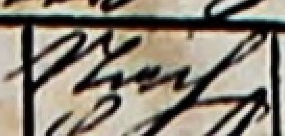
Nach
